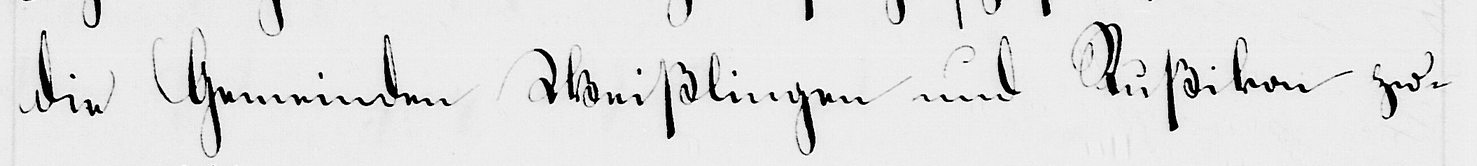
die Gemeinden Weißlingen und Rußikon zu¬
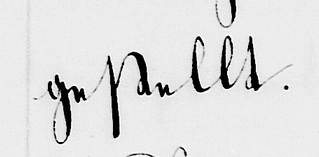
gestellt.
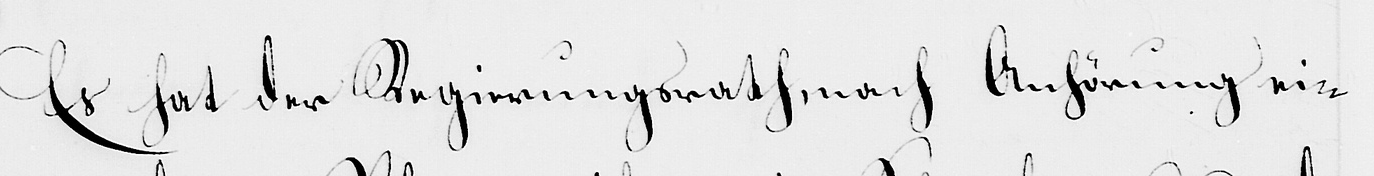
Es hat der Regierungsrath nach Anhörung ei¬
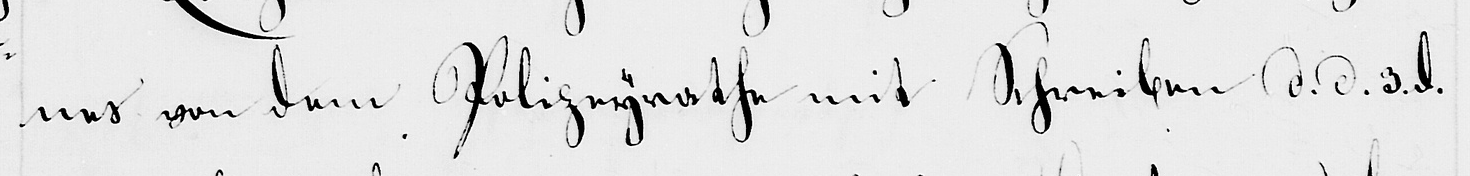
nes von dem Polizeyrathe mit Schreiben d. d. 3. d.
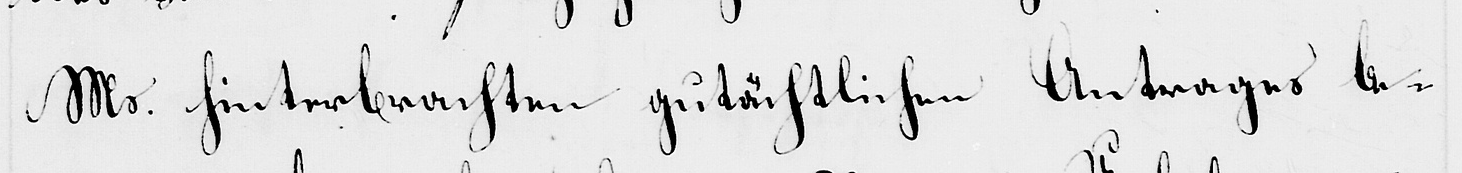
Ms. hinterbrachten gutächtlichen Antrages be¬
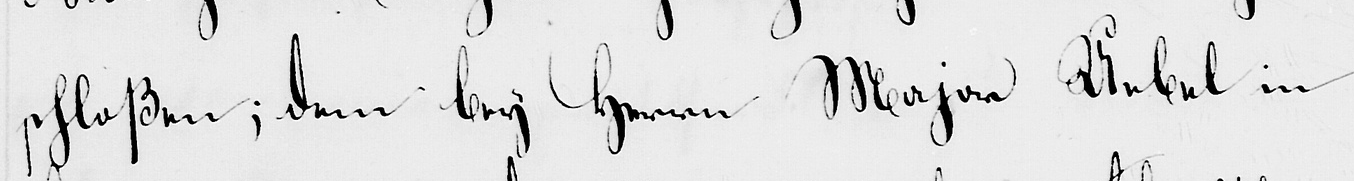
schloßen; dem bey Herrn Major Uebel in
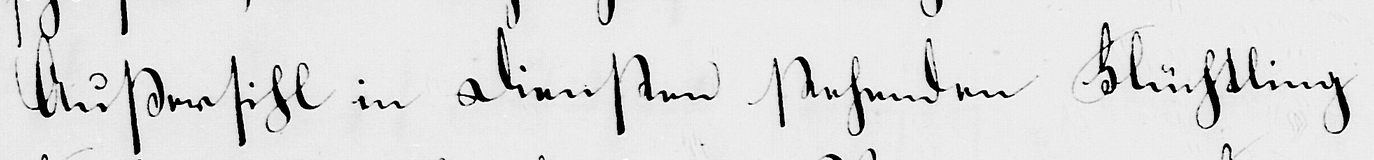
Aussersihl in Diensten stehenden Flüchtling
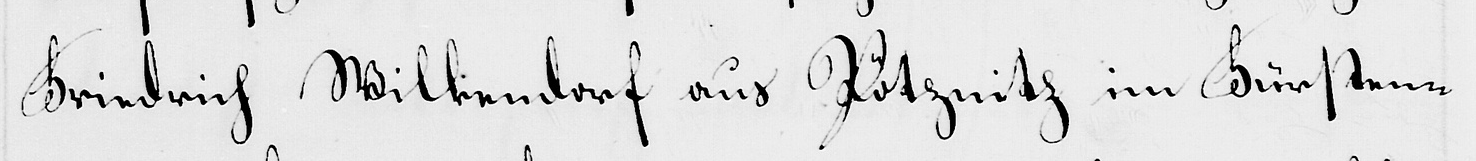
Friedrich Wilkendorf aus Pötznitz im Fürsten¬
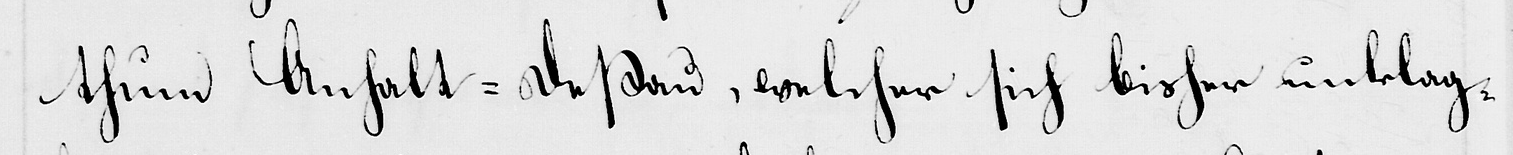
thum Anhalt-Dessau, welcher sich bisher unklag¬
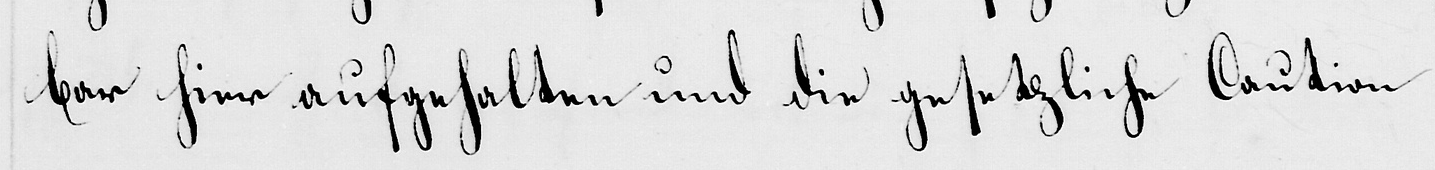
bar hier aufgehalten und die gesetzliche Caution
